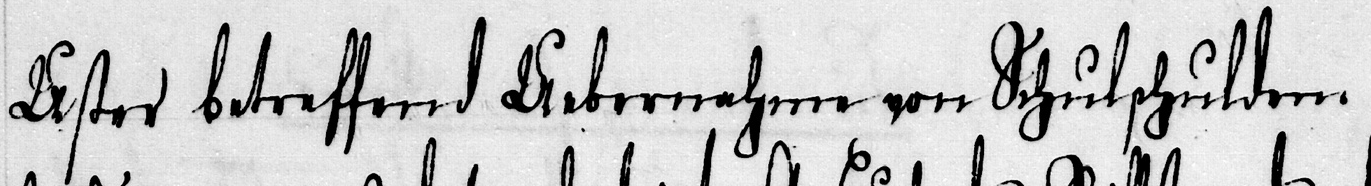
Uster betreffend Uebernahme von Schulschulden.
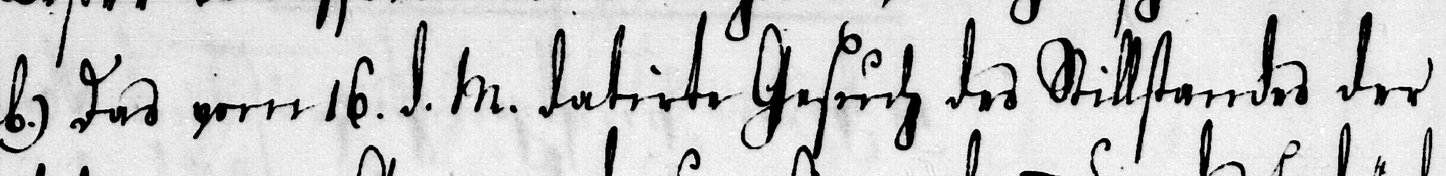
b.) Das vom 16. d. M. datirte Gesuch des Stillstandes der
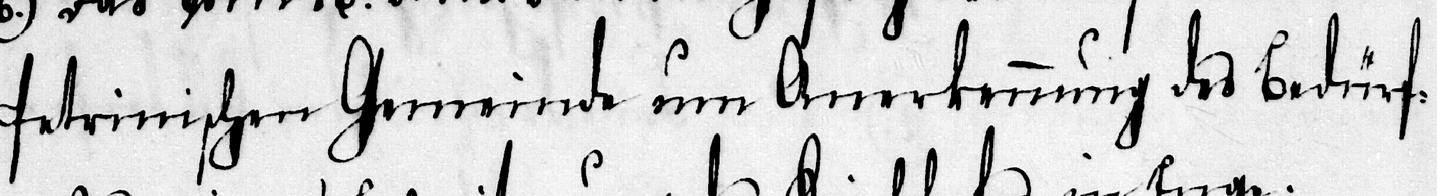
Petrinischen Gemeinde um Anerkennung des Bedürf¬
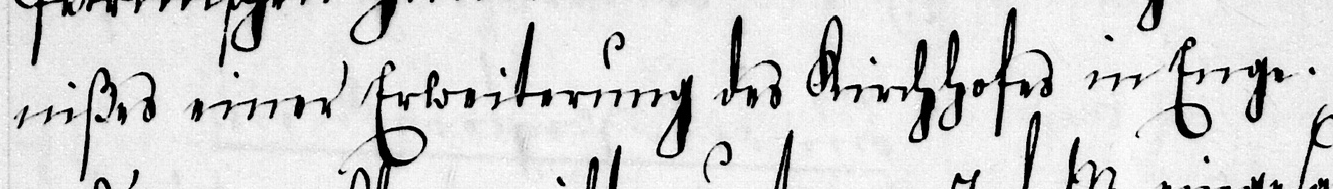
nißes einer Erweiterung des Kirchhofes in Enge.
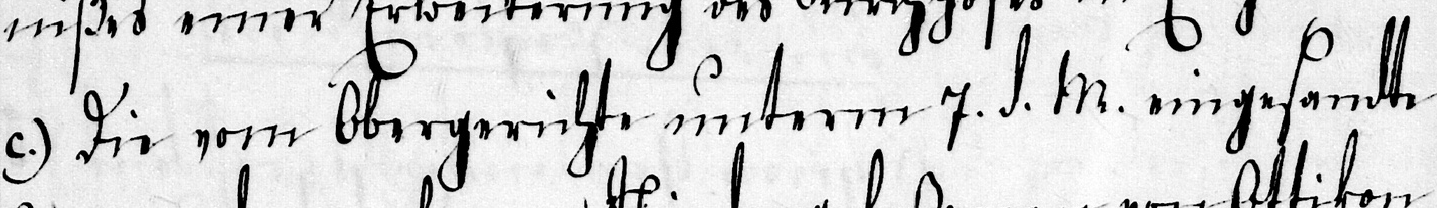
c.) Die vom Obergerichte unterm 7. d. M. eingesandte
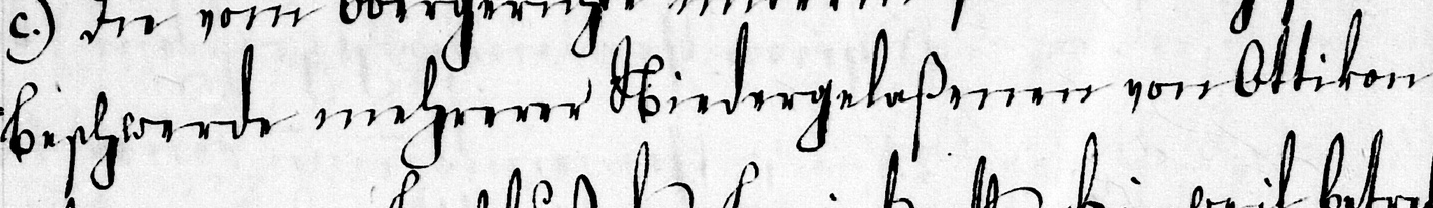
Beschwerde mehrerer Niedergelaßenen von Ottikon
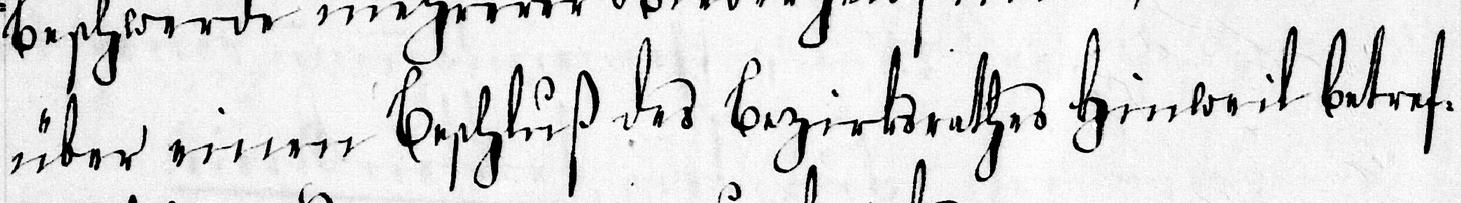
über einen Beschluß des Bezirksrathes Hinweil betref¬
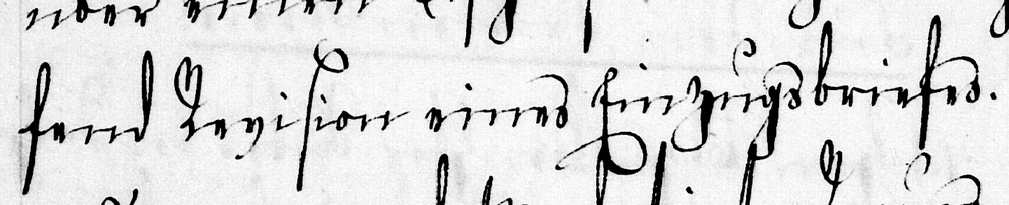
fend Revision eines Einzugsbriefes.
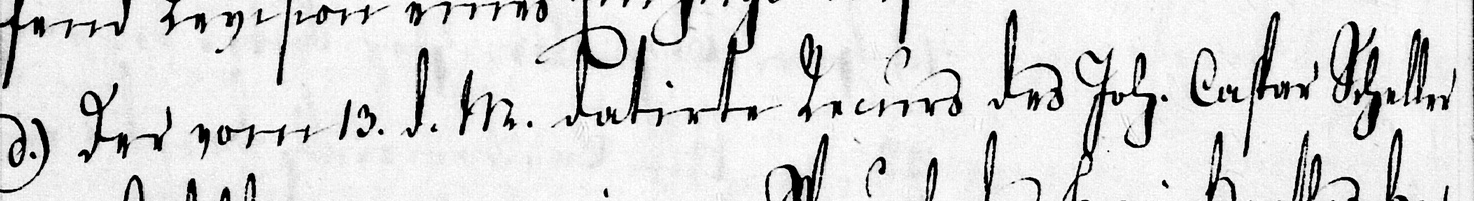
d.) Der vom 13. d. M. datirte Recurs des Joh. Caspar Schel¬
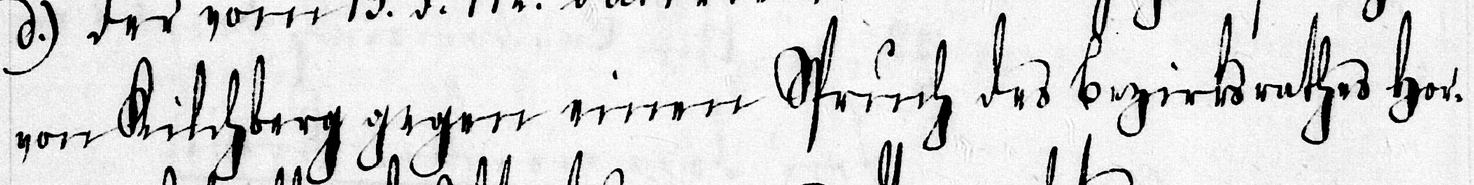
von Kilchberg gegen einen Spruch des Bezirksrathes Hor¬
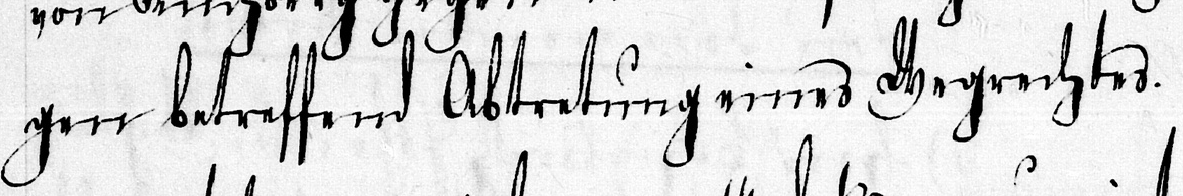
gen betreffend Abtretung eines Wegrechtes.
